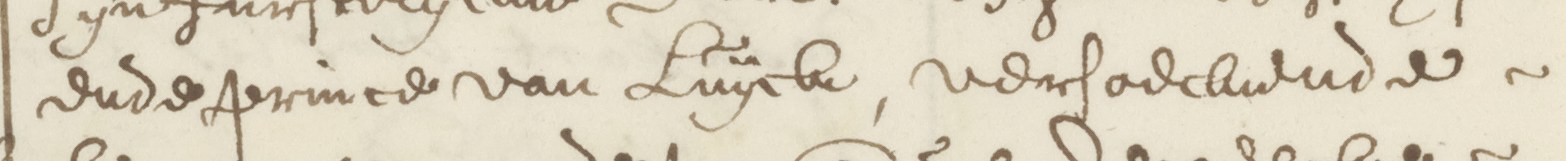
ende Prince van Luijck, versoeckende
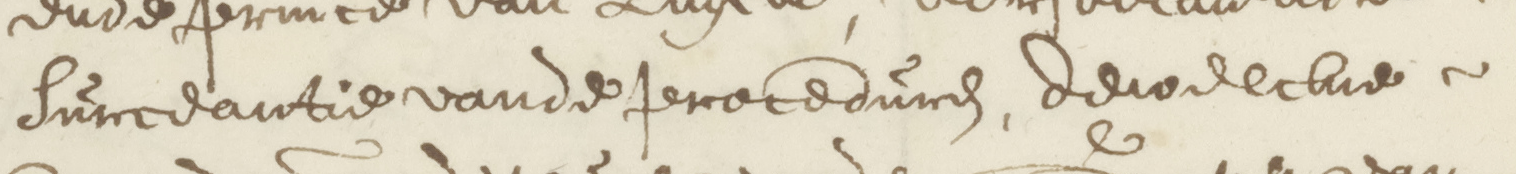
surceantie vande proceduren, dewelcke-
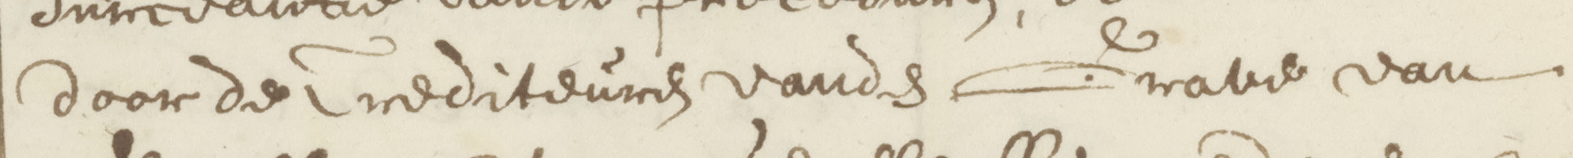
door de Crediteuren vanden Grave van
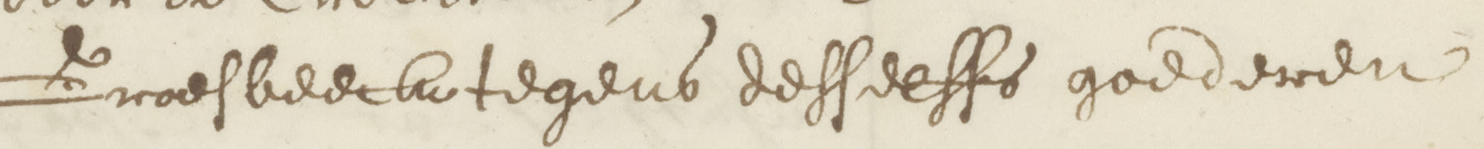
Groesbeeck tegens desselffs goederen
